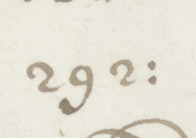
292:
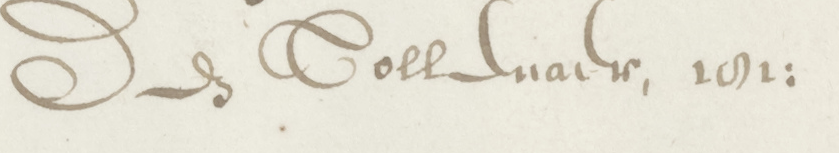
Den Tollenaer, 181:
